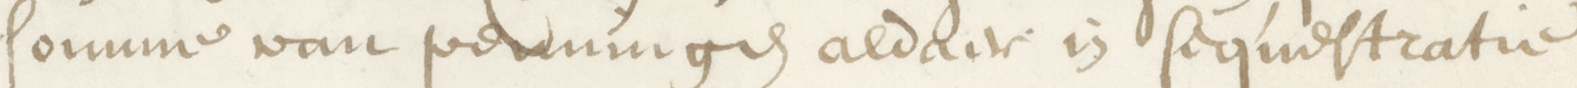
somme van penningen aldaer in sequestratie
